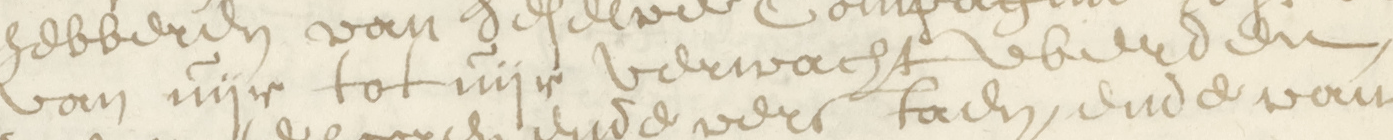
van uijr tot uijr verwacht werden,
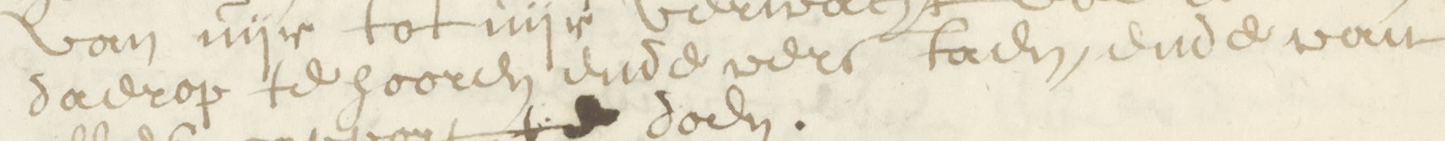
daerop te hooren ende verstaen, ende van
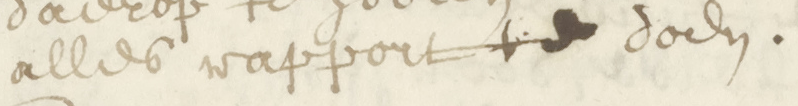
alles rapport te doen.
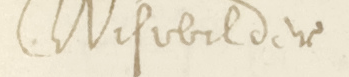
Wiswilder
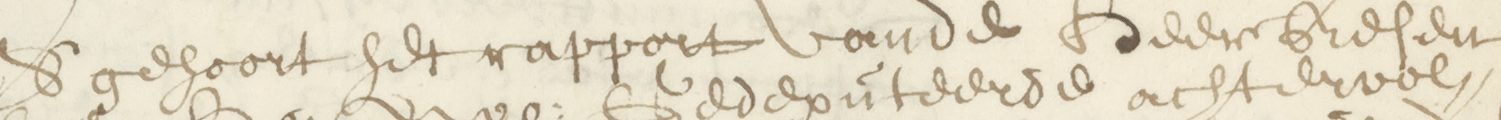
Is gehoort het rapport van de Heer Resen
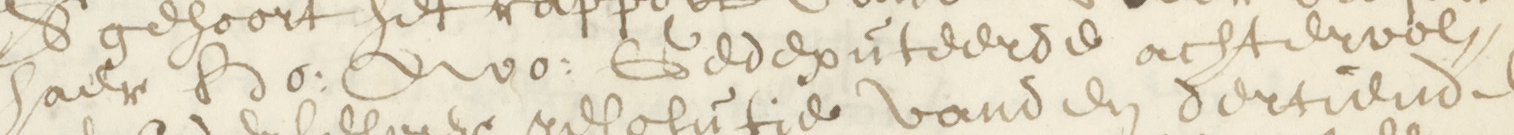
haer Ho:Mo: Gedeputeerde achtervol„
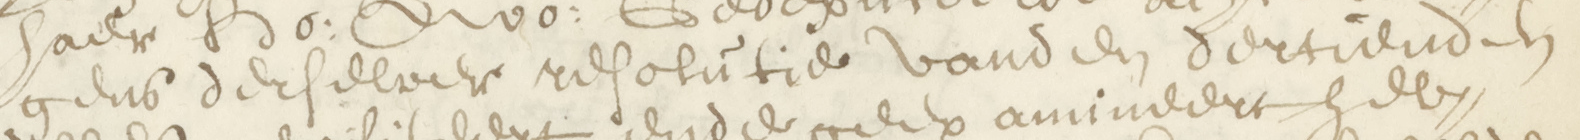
gens derselver resolutie vanden dertienden
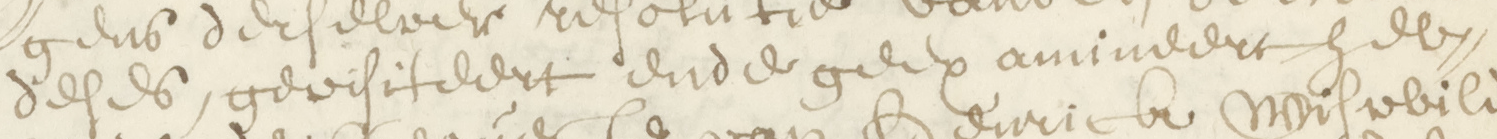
deses, gevisiteert ende geexamineert heb„
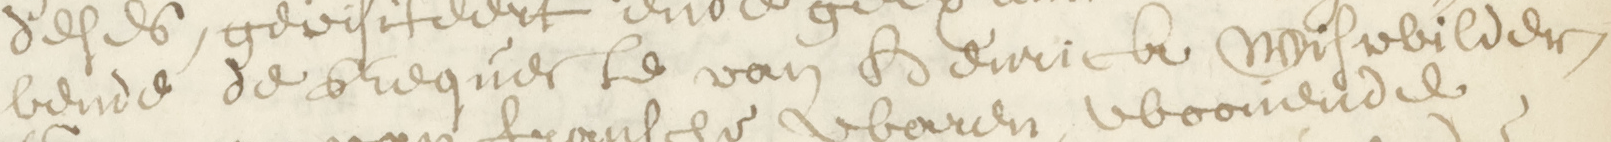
bende de Requeste van Henrick Wiswilder,
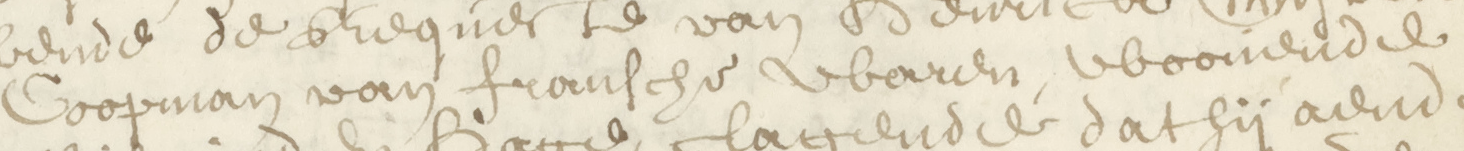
Coopman van fransche waren, woonende
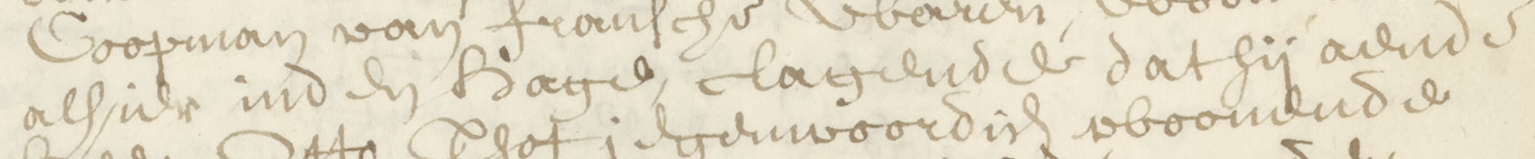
alhier inden Hage, clagende dat hij aende
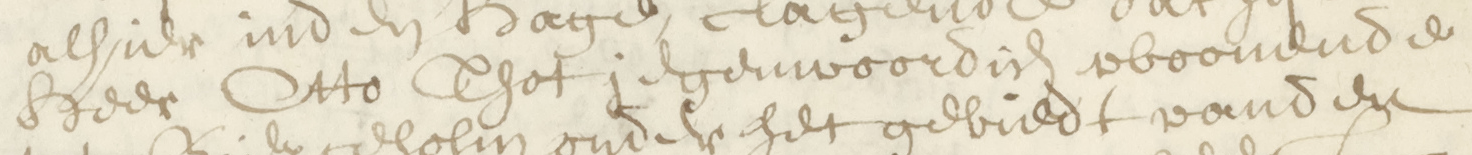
Heer Otto Thot jegenwoordich woonende
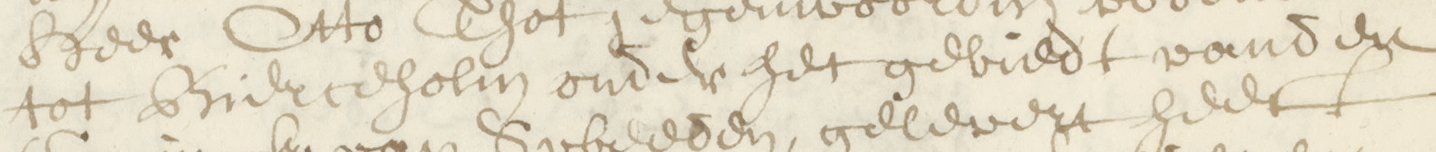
tot Bierceholm onder het gebiedt vanden
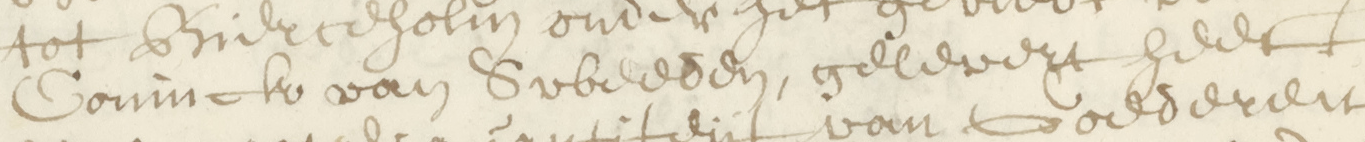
Coninck van Sweeden, gelevert heeft
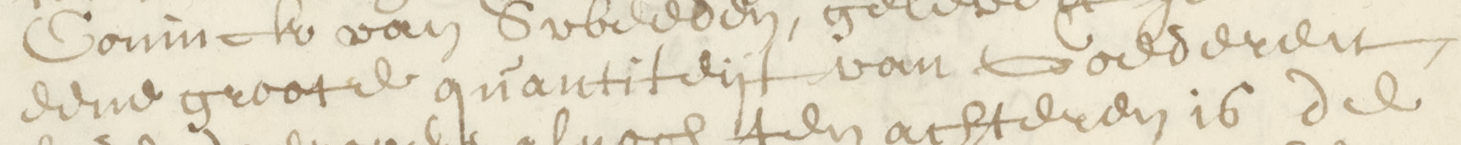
eene groote quantiteijt van Goederen,
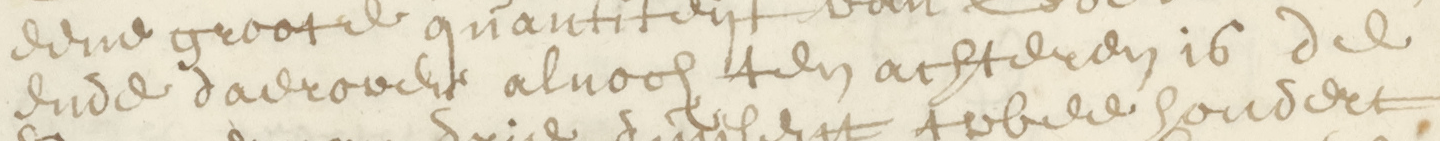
ende daerover alnoch ten achteren is de
